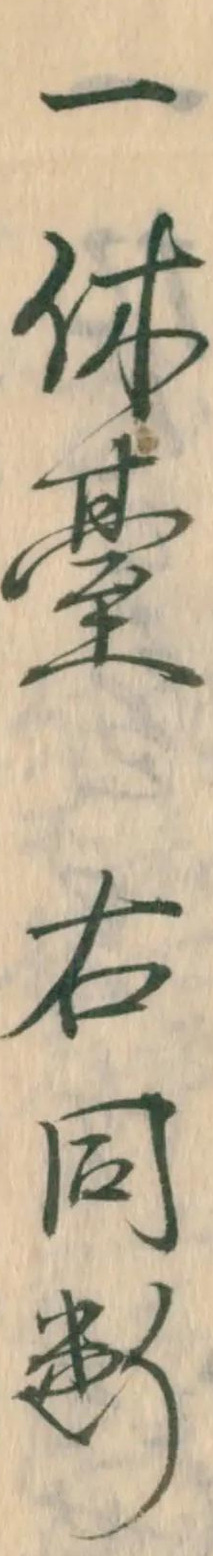一休台右同断
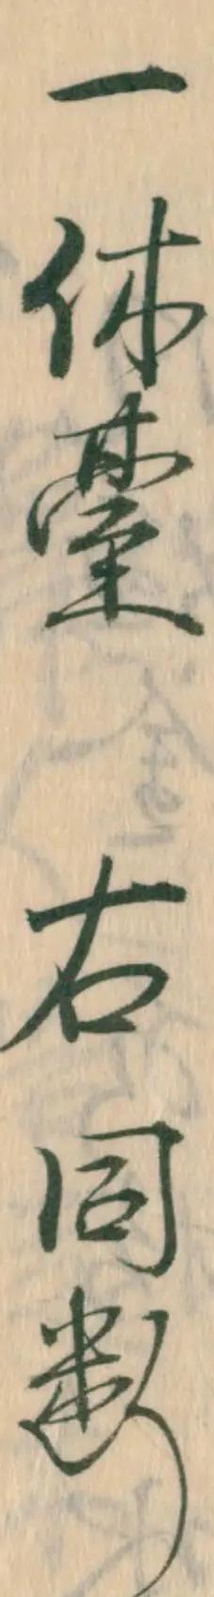一休台右同断
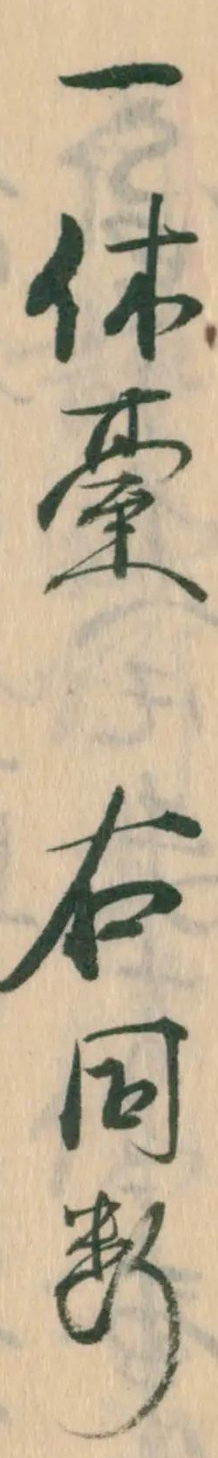一休台右同断
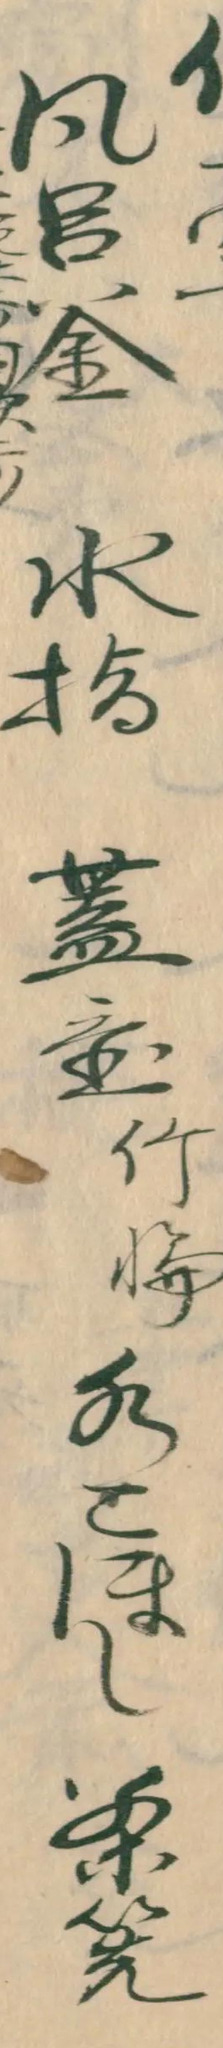風呂金水指蓋置竹輪水こほし茶筅
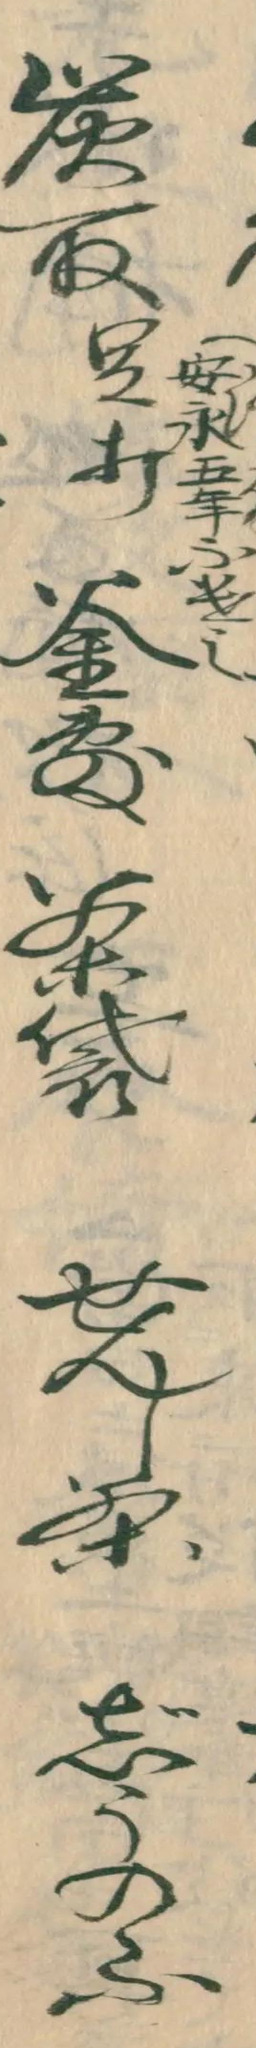炭取足打釜敷茶袋せんし茶じうのふ

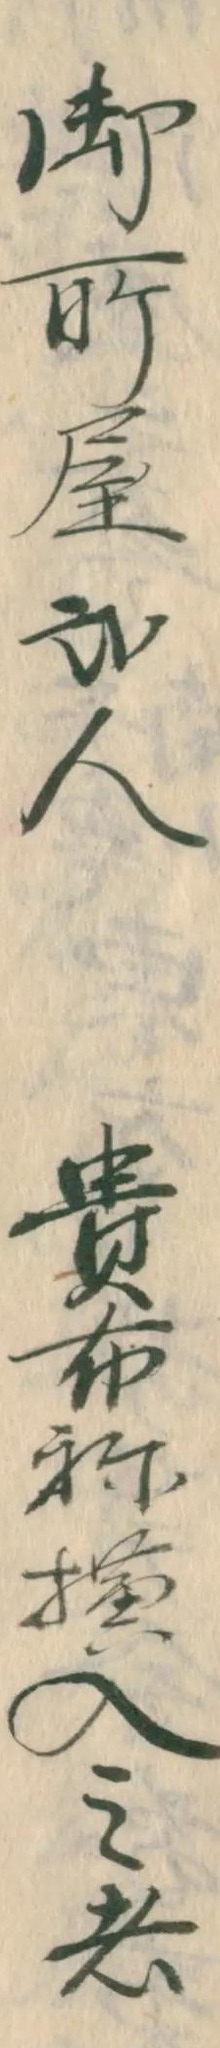御所屋弐人貴布祢横入之者
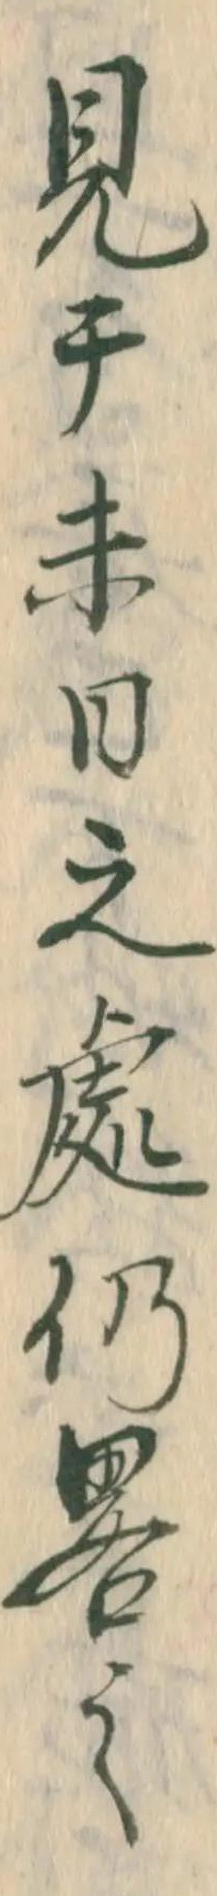見于未日之処仍略之

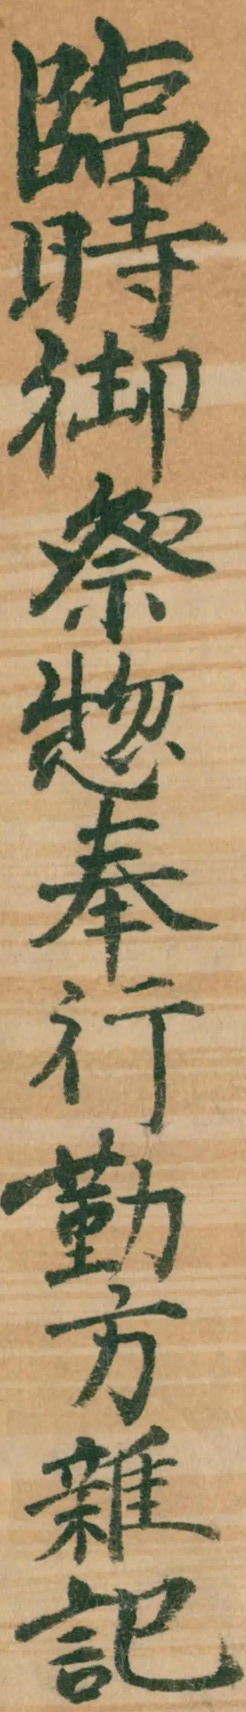臨時御祭惣奉行勤方雑記

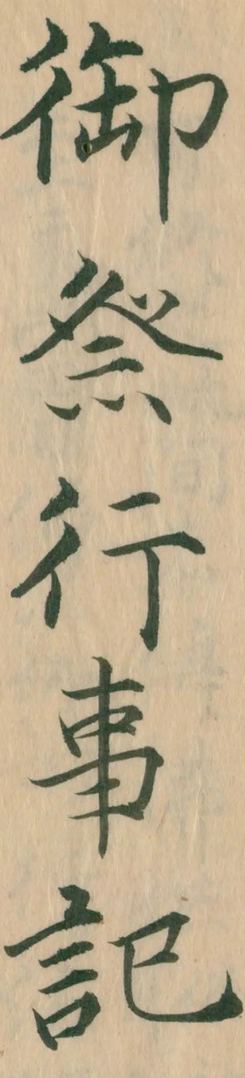御祭行事記

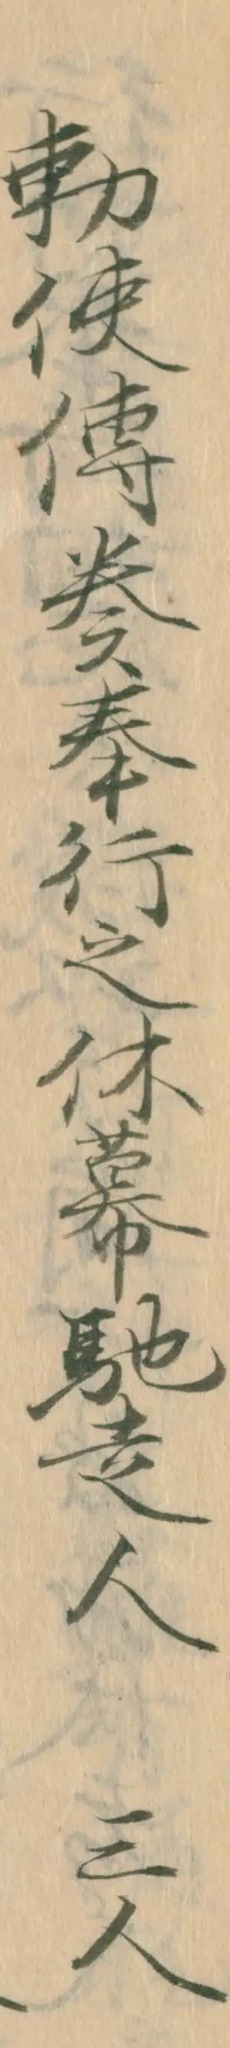一勅使伝奏奉行之休幕馳走人三人
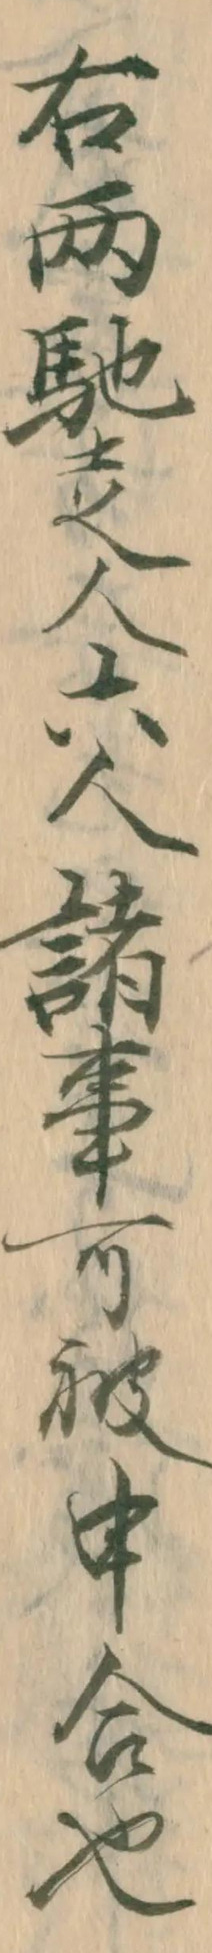右両馳走人六人諸事可被申合也
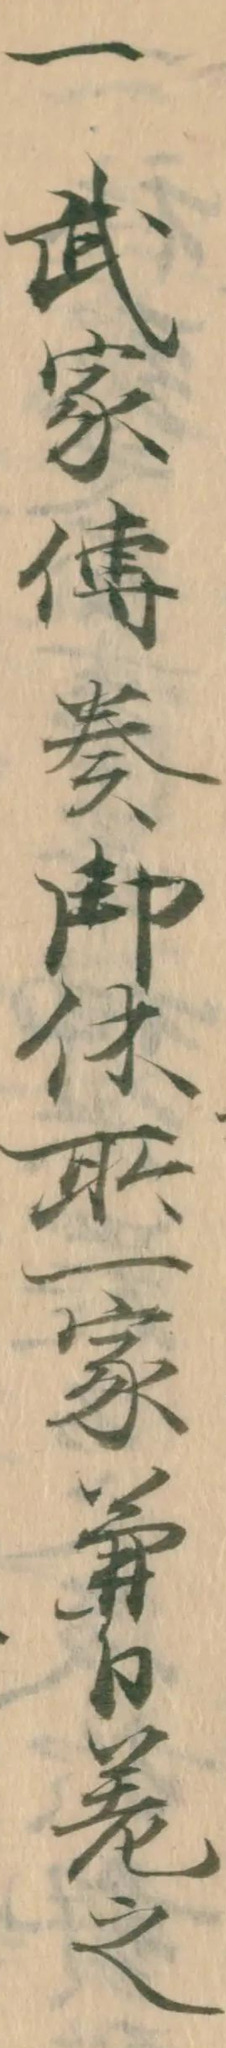一武家伝奏御休所一家兼日差之
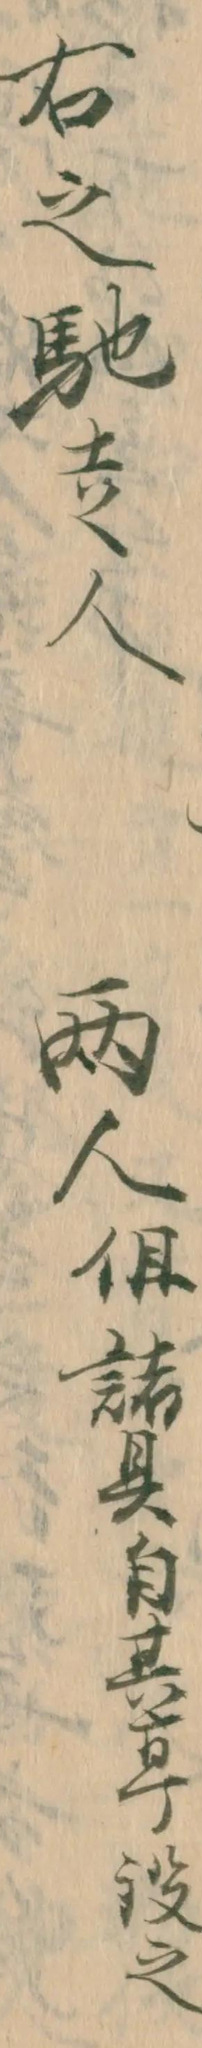右之馳走人両人但諸具自其亭設之
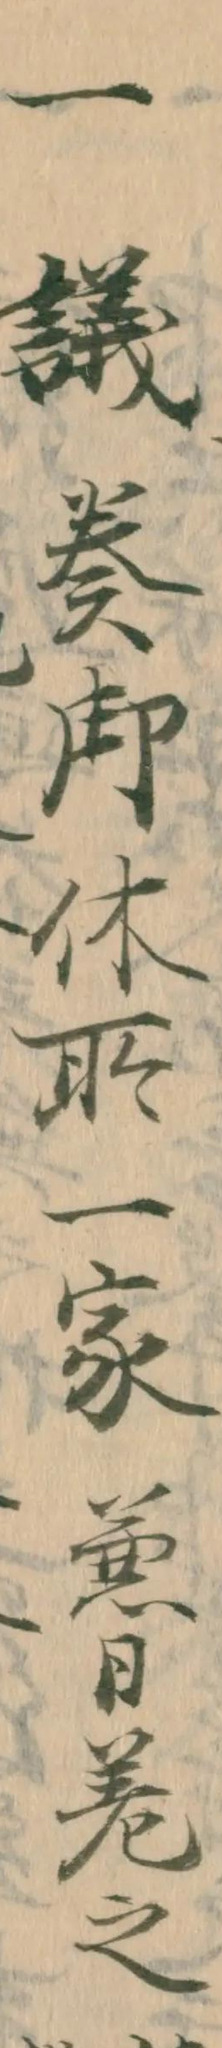一武家伝奏御休所一家兼日差之
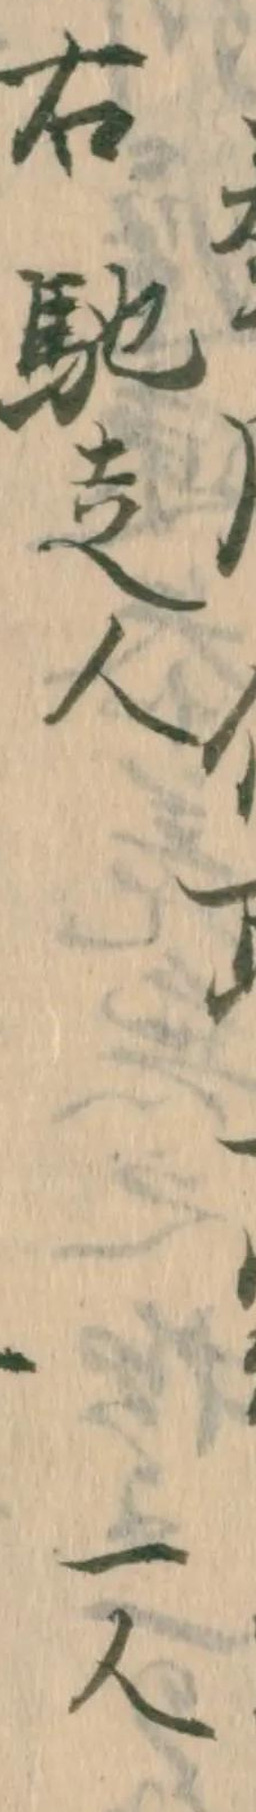右馳走人一人
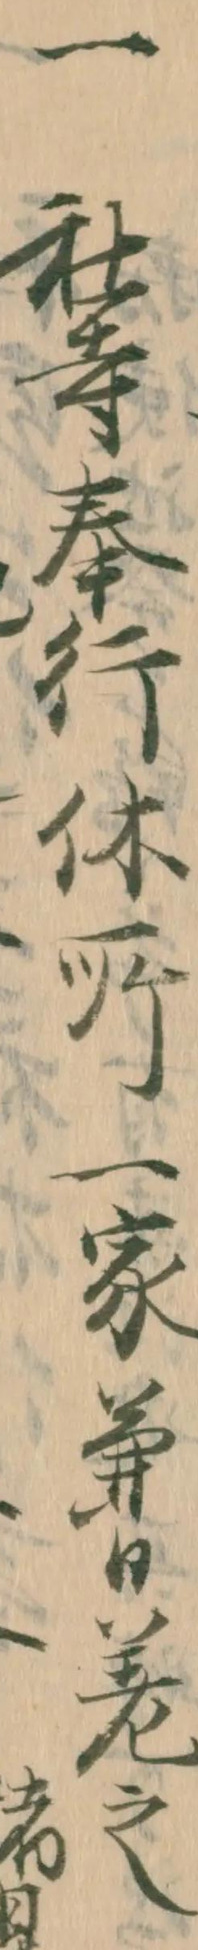一社寺奉行休所一家兼日差之
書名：賀茂社記録. 第6冊
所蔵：国立国会図書館 National Diet Library, JAPAN
